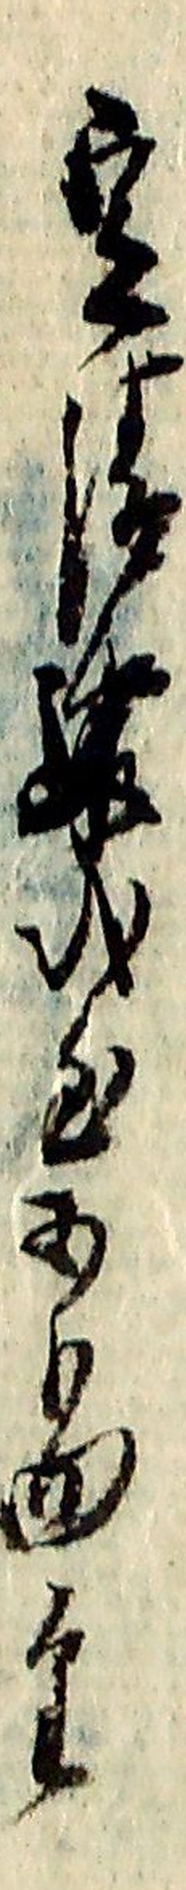定請銀弐匁五分四厘
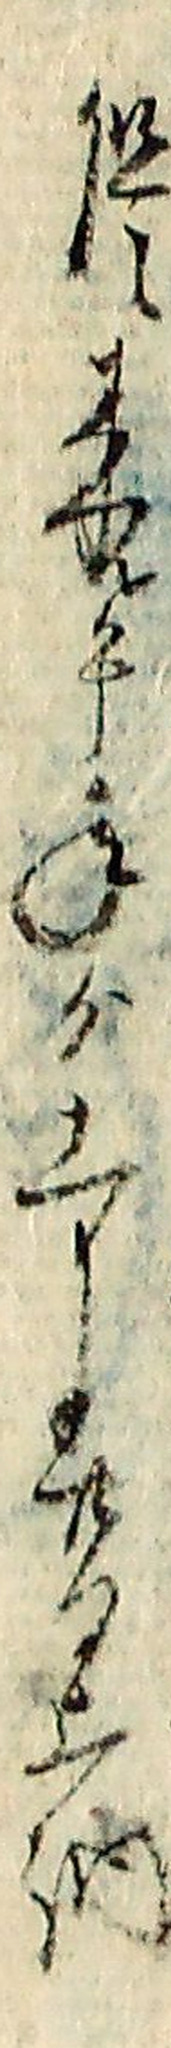但し来る午年ゟ十一月廿日上納
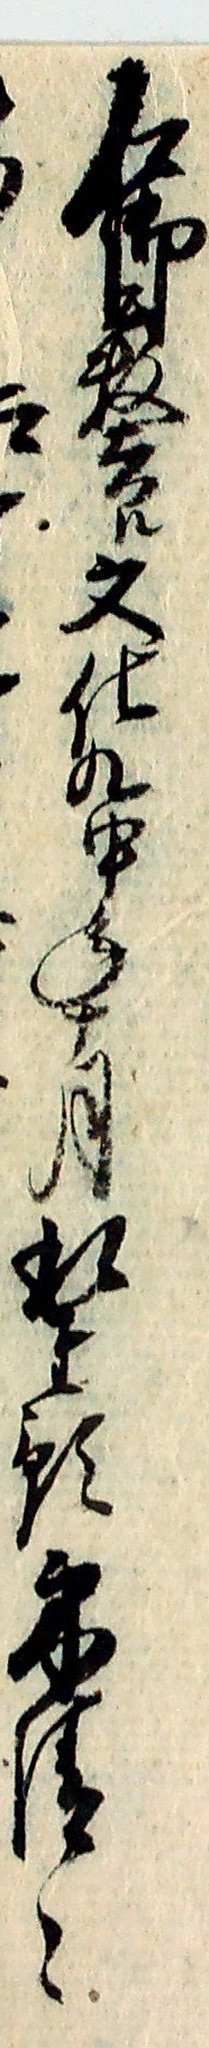右御藪去る文化九申年十月私奉預束請に
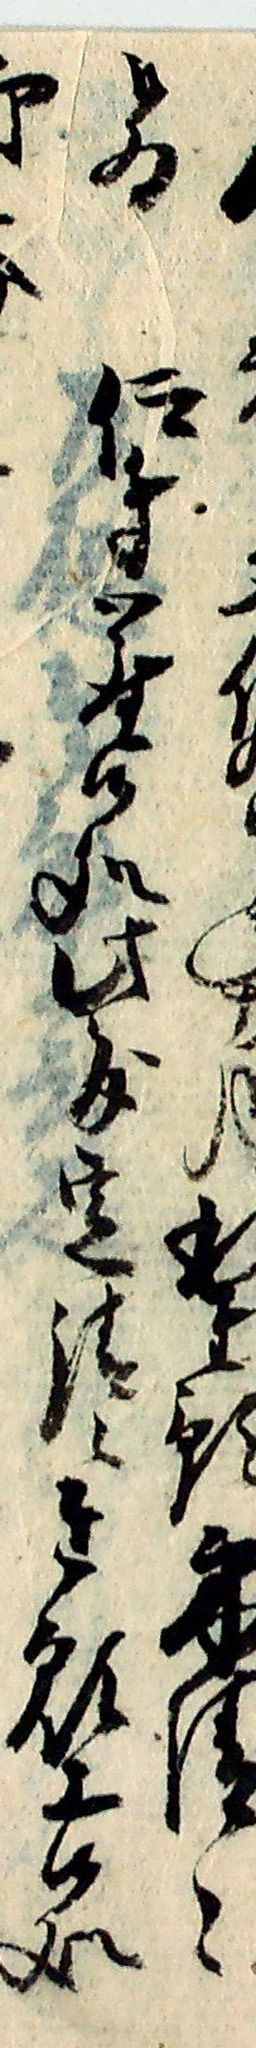被為仰付御座候処此度定請に奉願上候処
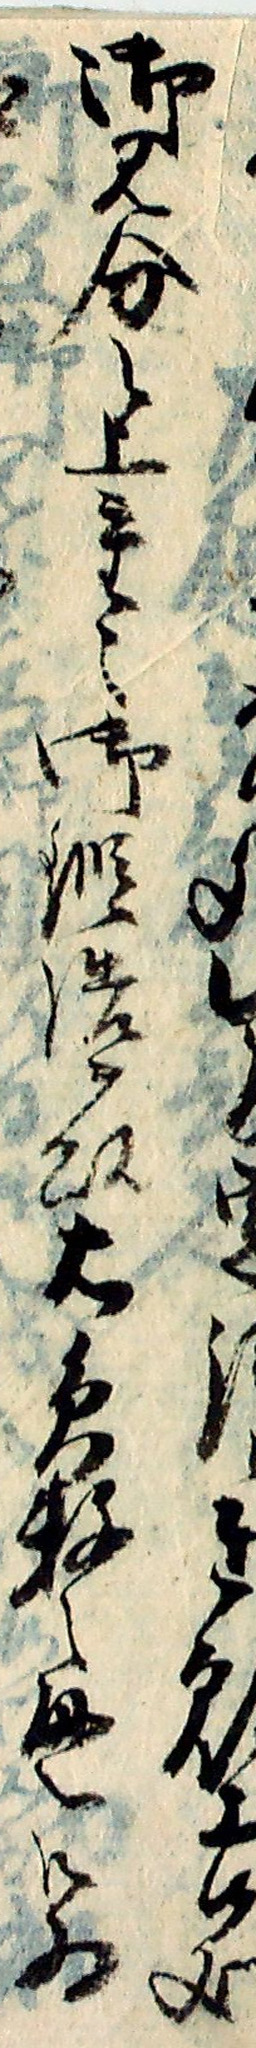御見分之上重々御鍛詰を以右員数之通被為
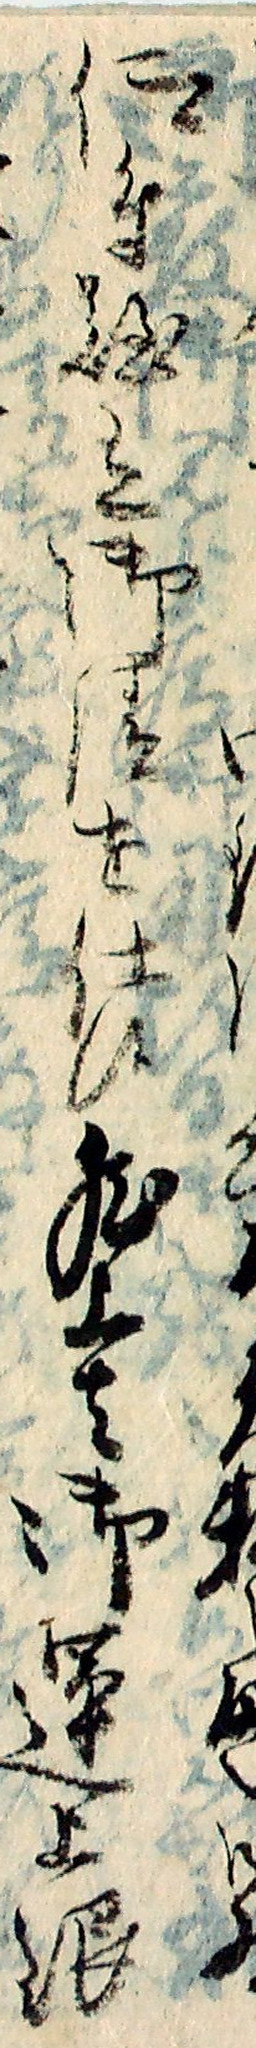仰付難有御請を仕候然上は御運上銀
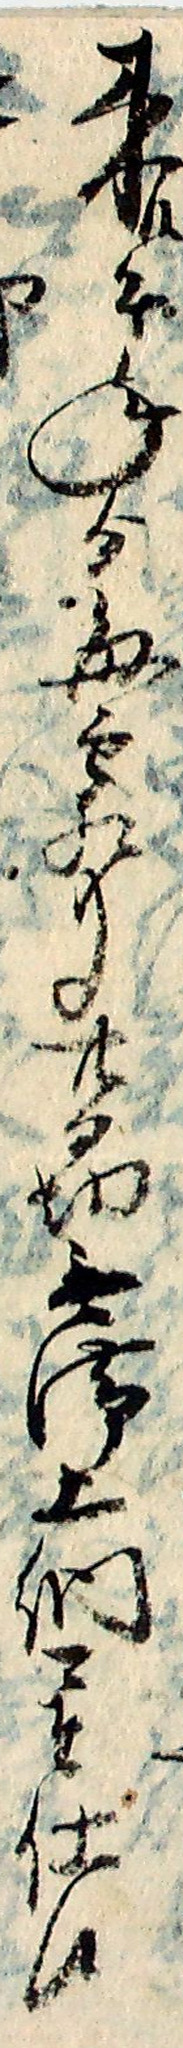来る午年ゟ毎霜月廿日切無滞上納可奉仕候
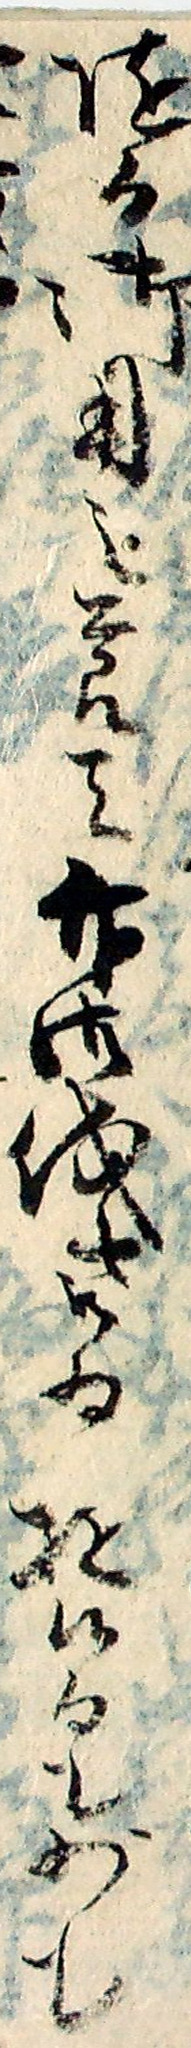随て御用之節は竹御伐り被為遊候ても少も
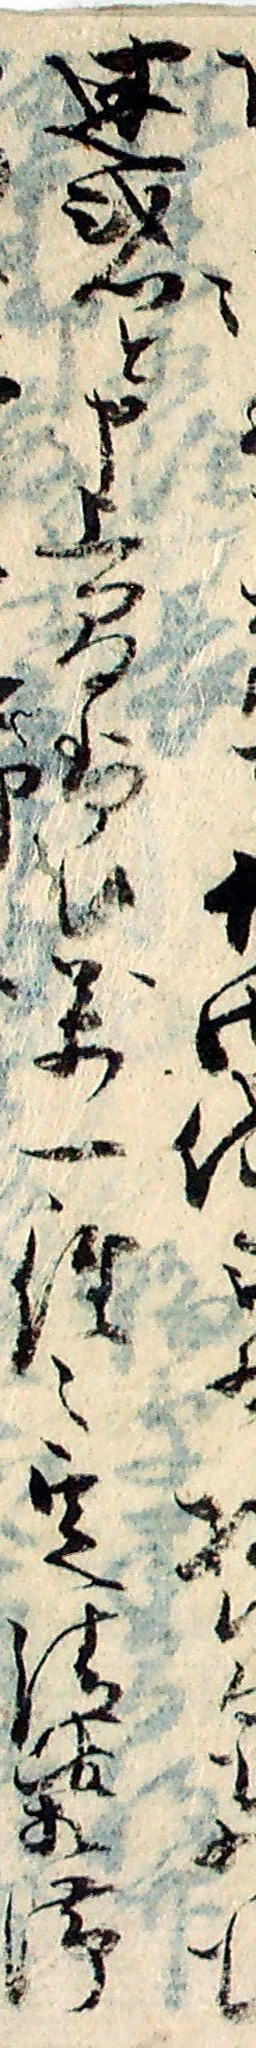迷惑と申上間布候万一往々定請銀相滞
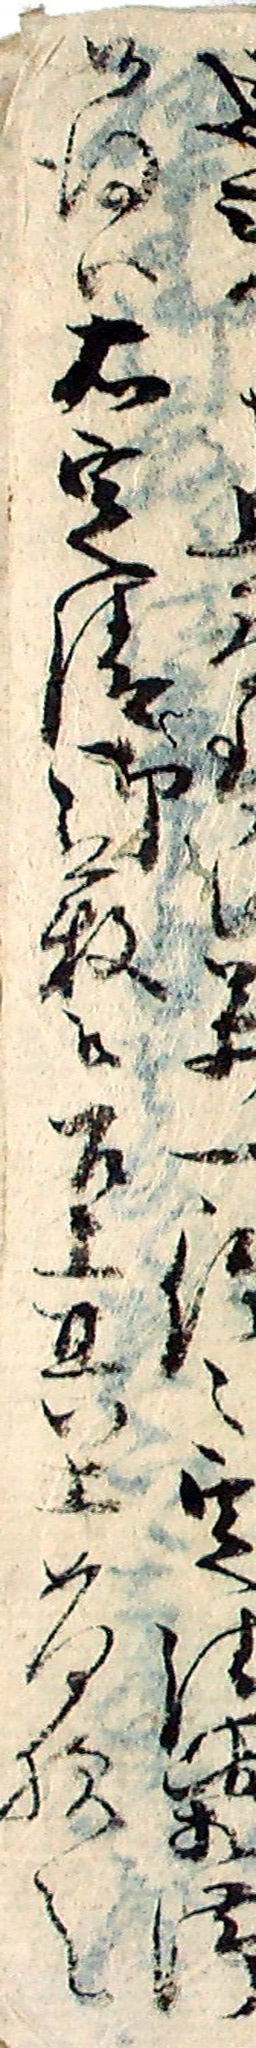候得は右定請御藪被召上其上如何様之

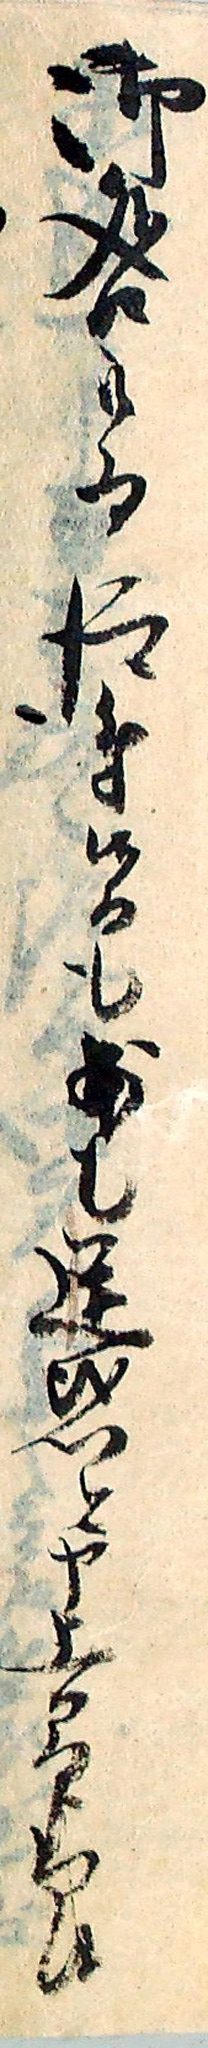御咎被為仰付候ても少も迷惑と申上間布候
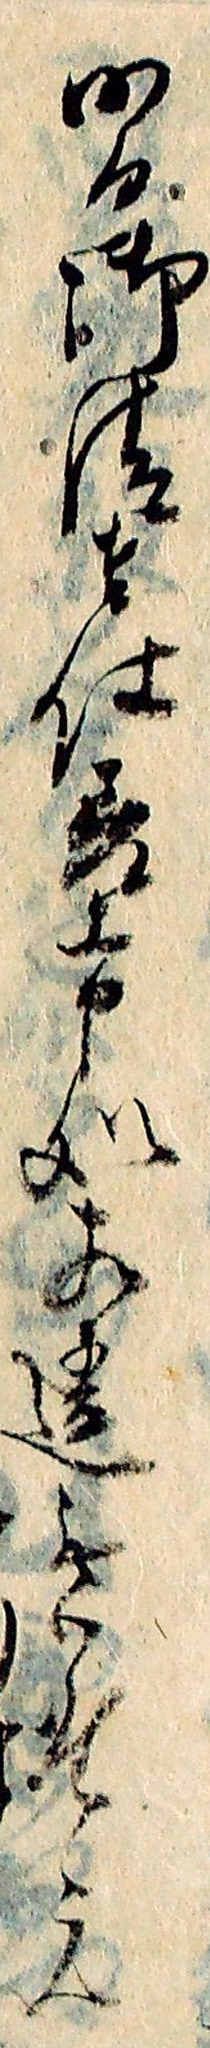仍て御請書仕差上申処相違無御座候以上
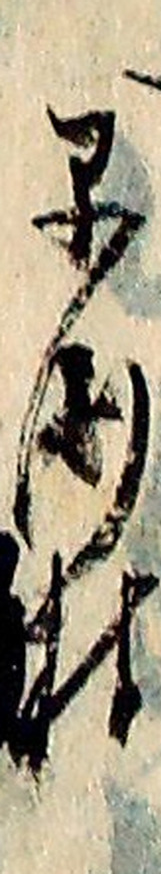早淵村
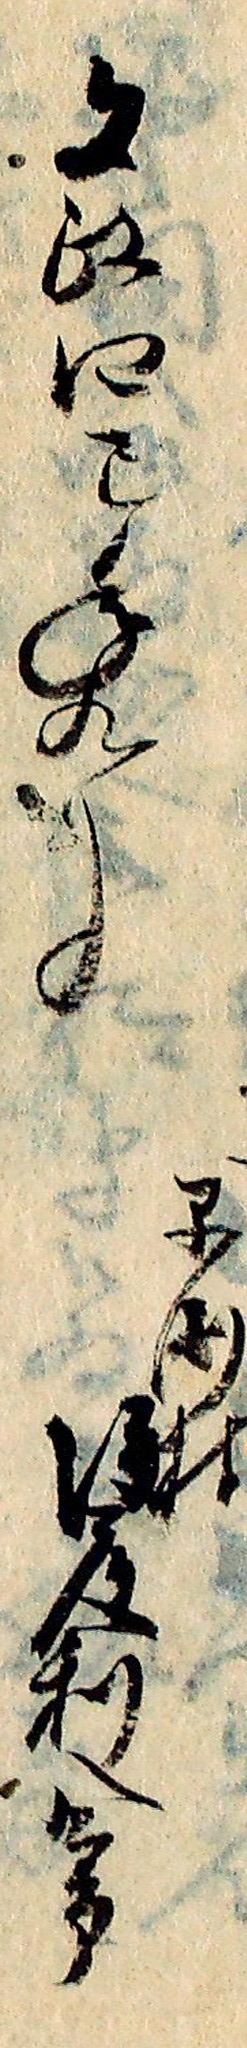文政四巳年九月後藤利八郎
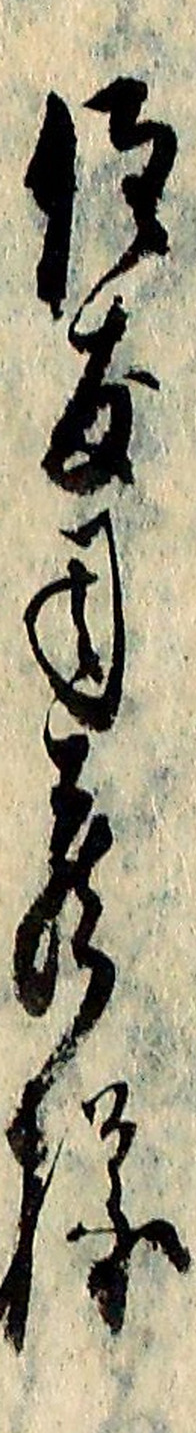住友周蔵様
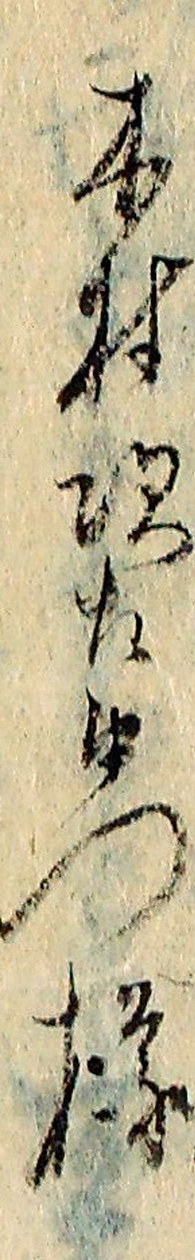木村次左衛門様
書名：諸御願書控(後藤氏壱番）
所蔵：鳴門教育大学 Naruto University of Education
